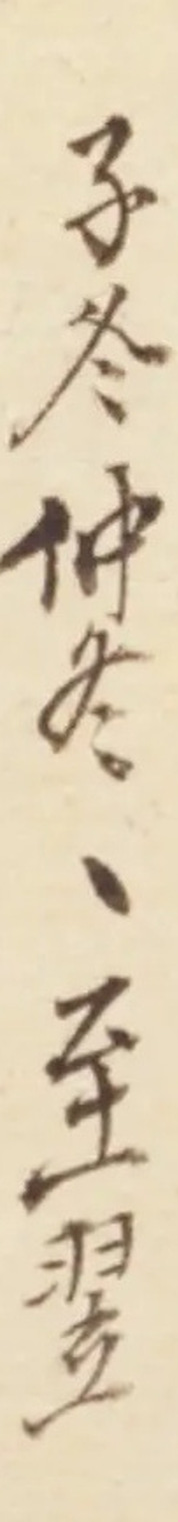子冬仲冬至翌
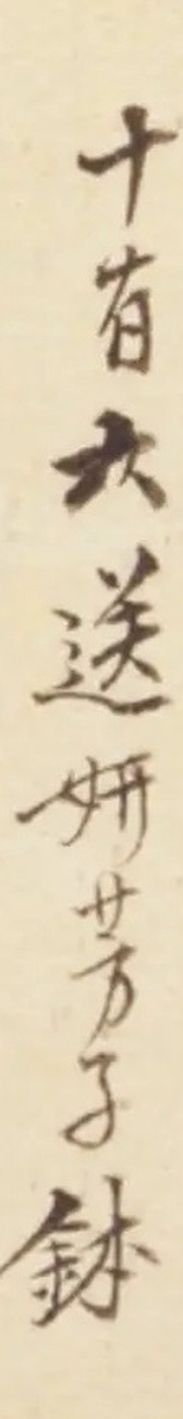十有六送妍芳子鉢
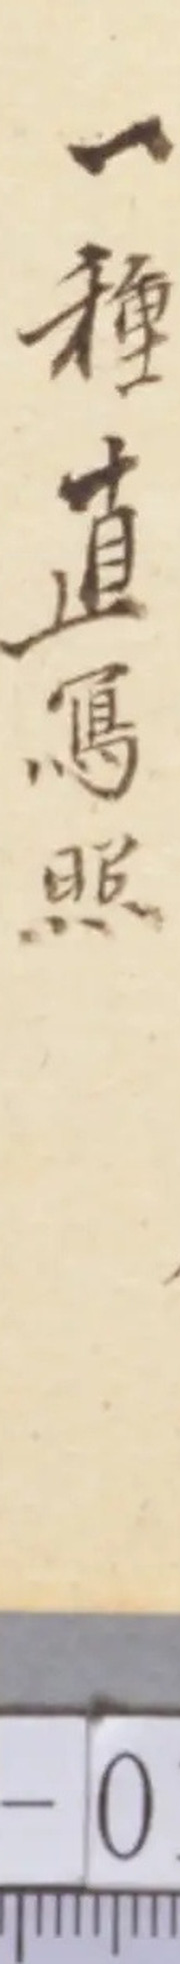一種直写照
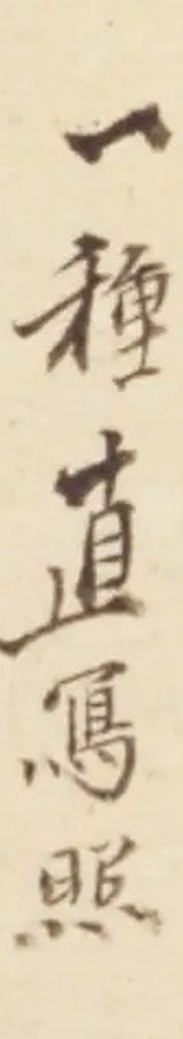一種直写照

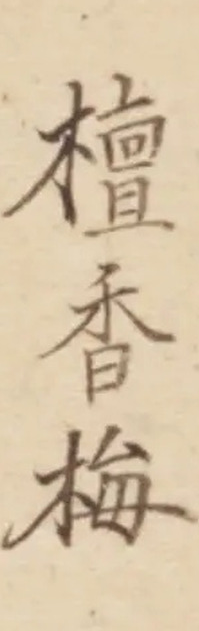檀香梅
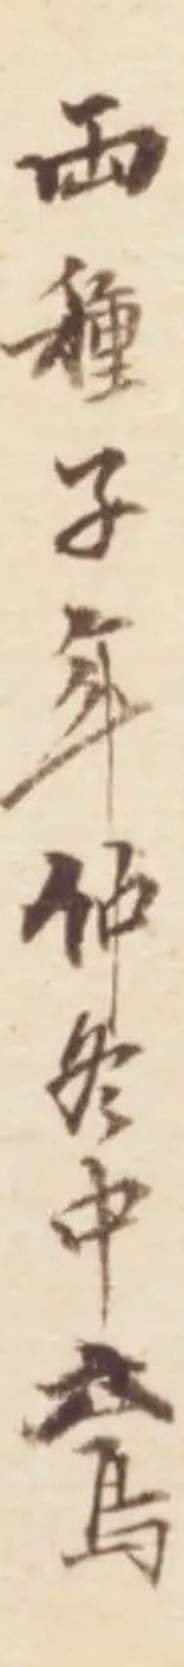両種子年仲冬中六島
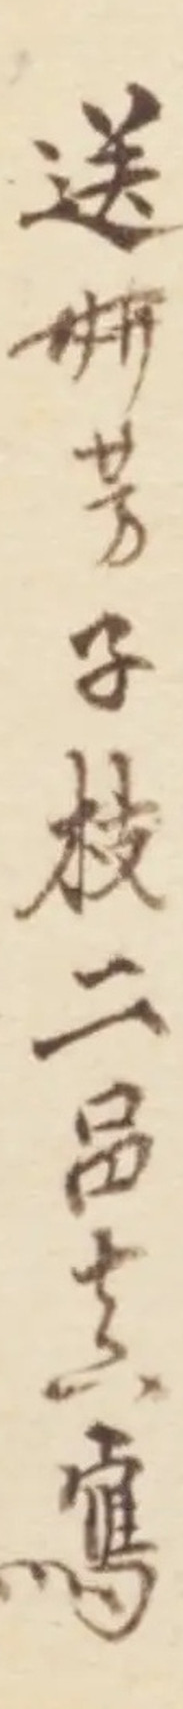送妍芳子枝二品真写

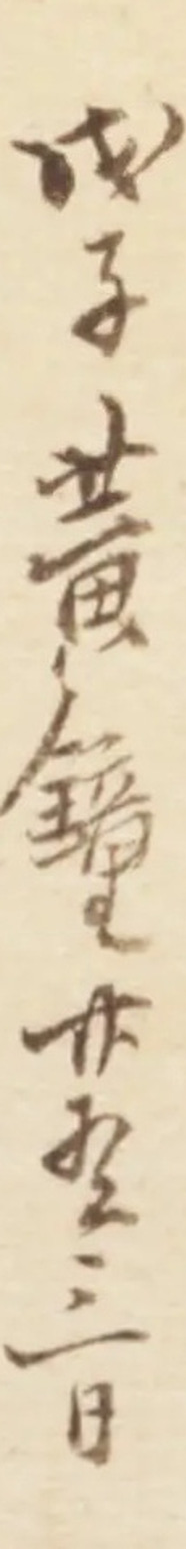戊子黄鐘廿有三日
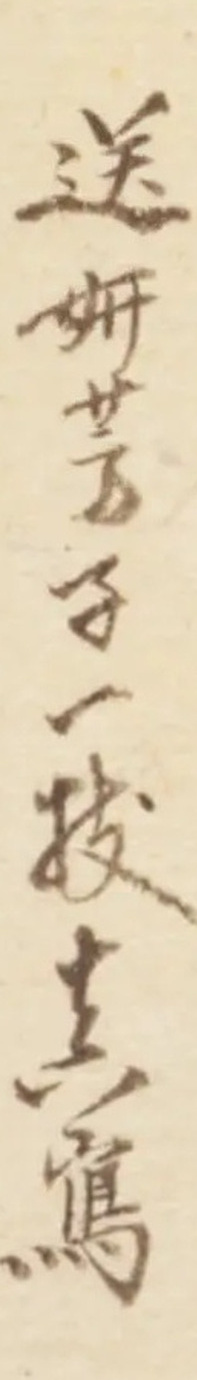送妍芳子一枝真写

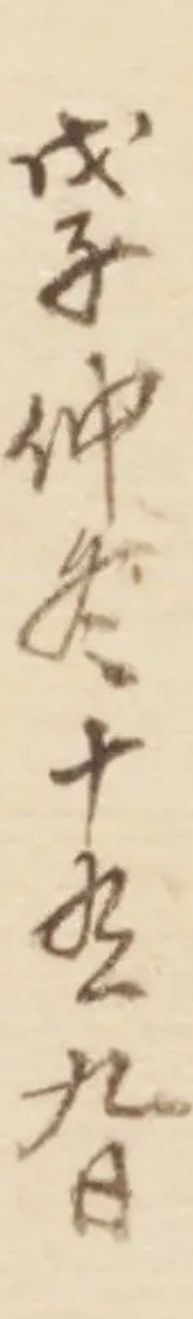戊子仲冬十有九日
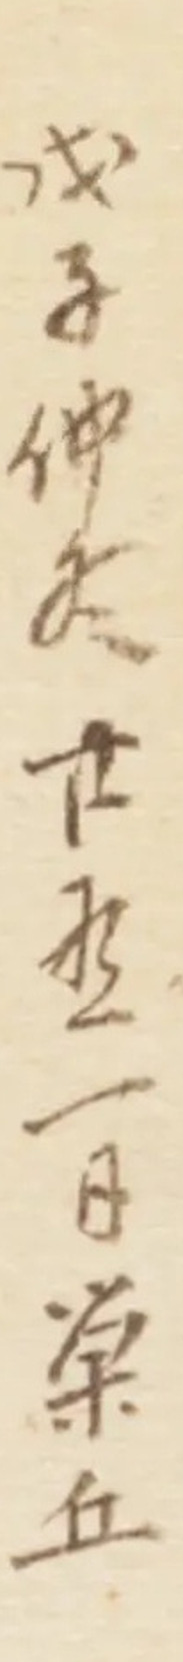戊子仲冬廿有一日丘

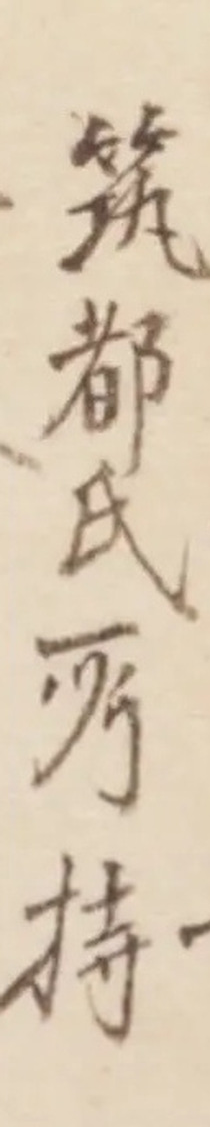築都氏所持
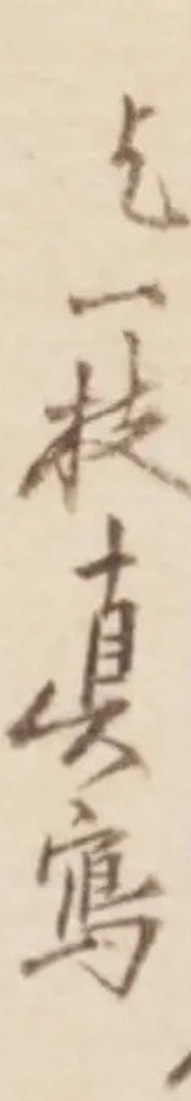乞一枝真写
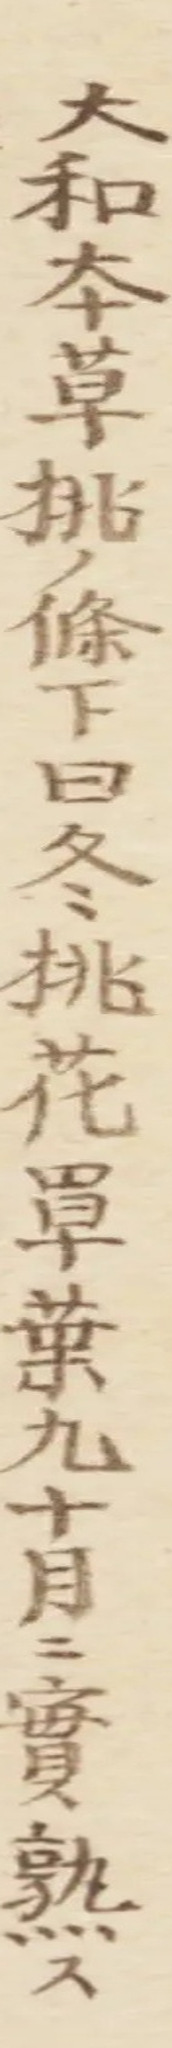大和本草桃ノ條下曰冬桃花単葉九十月ニ実熟ス
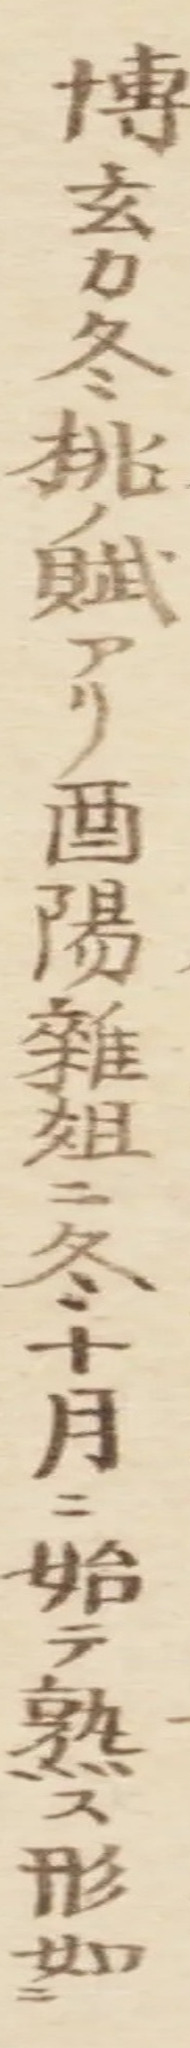博玄カ冬桃ノ賦アリ酉陽雑俎ニ冬十月ニ始テ熟ス形如
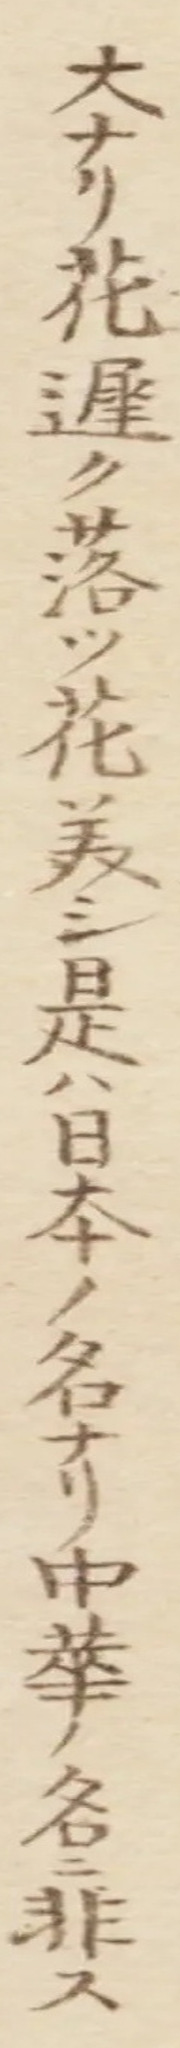大ナリ花遅ク落ツ花美シ是ハ日本ノ名ナリ中華ノ名ニ非ス
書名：梅園草木花譜冬之部
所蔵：国立国会図書館 National Diet Library, JAPAN
